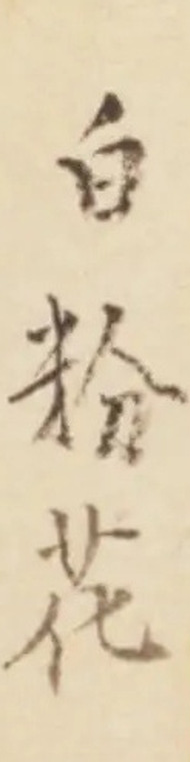白粉花
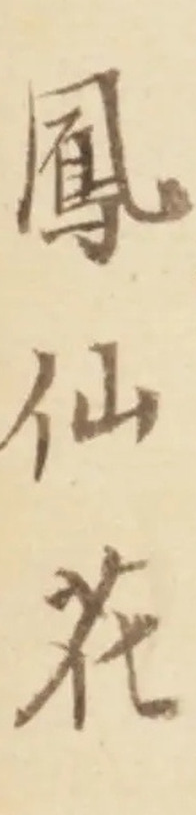鳳仙花
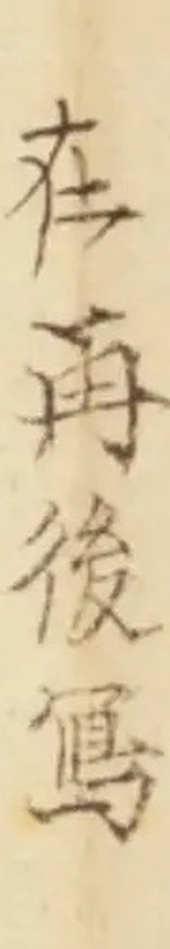在再後写
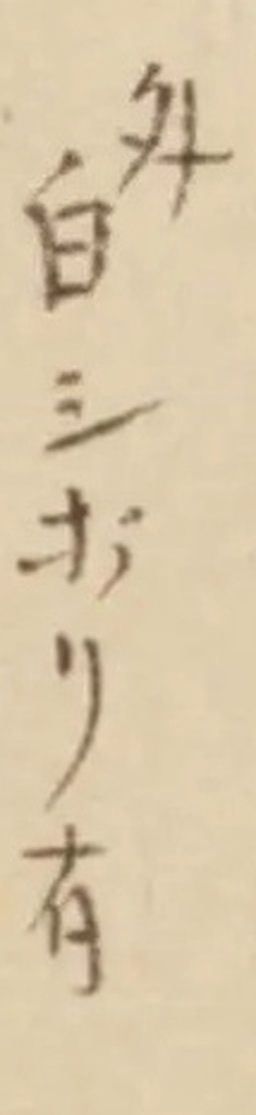白シボリ有
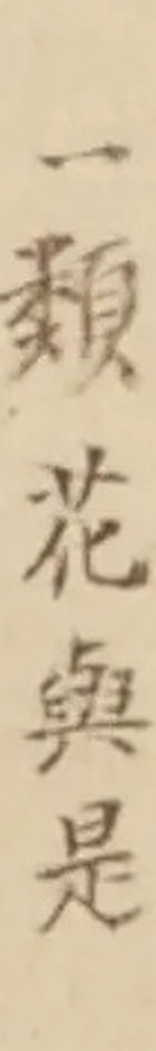一類花興是
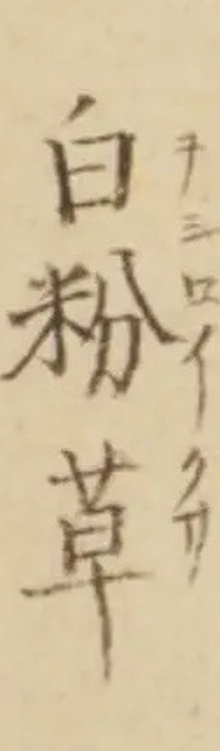白粉花

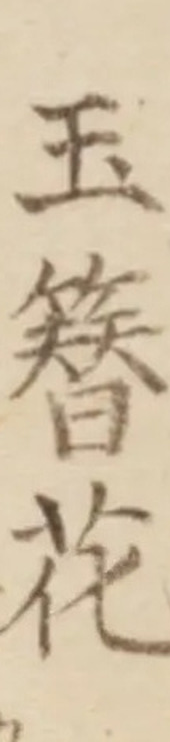玉簪花
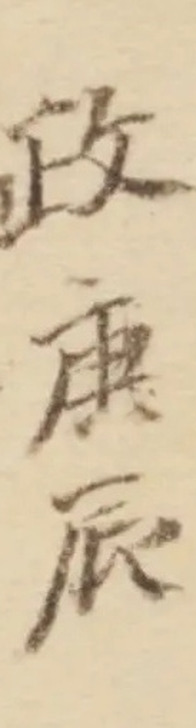政庚辰
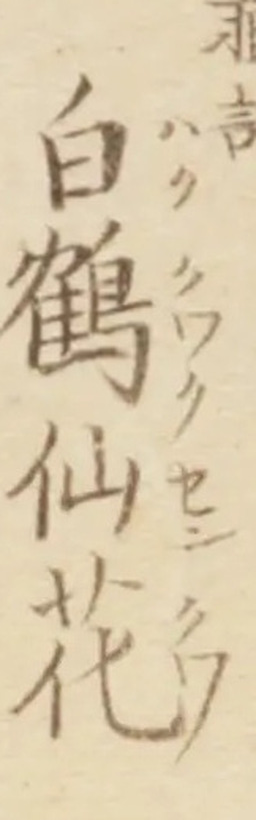白鶴仙花

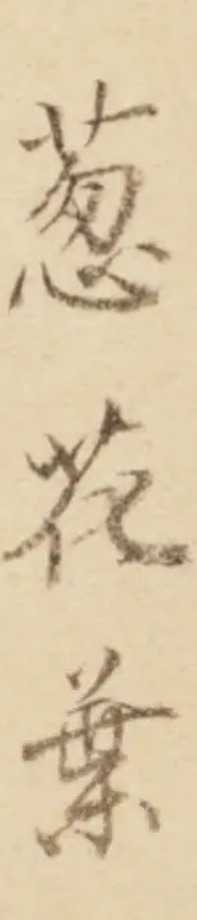葱花葉

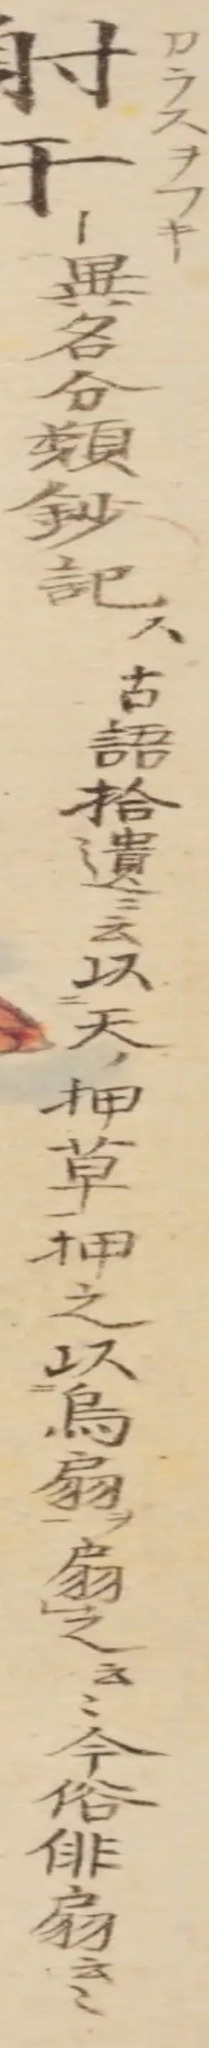射干異名分類鈔記ハ古語拾遺ニ云以天ノ押草押之以鳥扇扇之云今俗俳扇云々
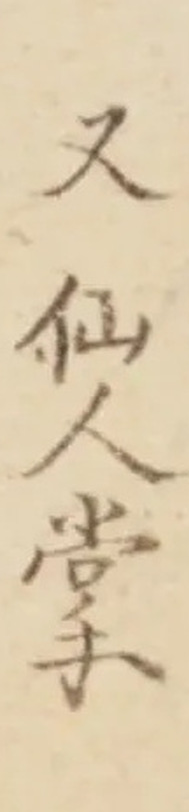又仙人掌
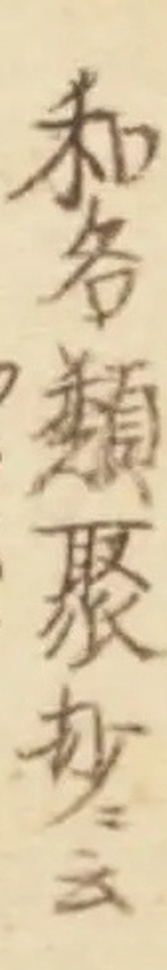和名類聚抄ニ云
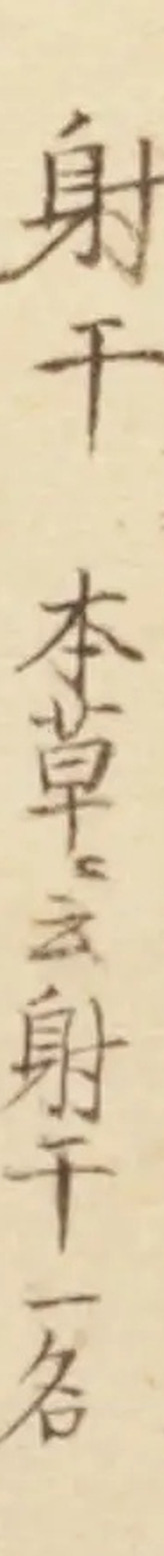射干本草ニ云射干一名
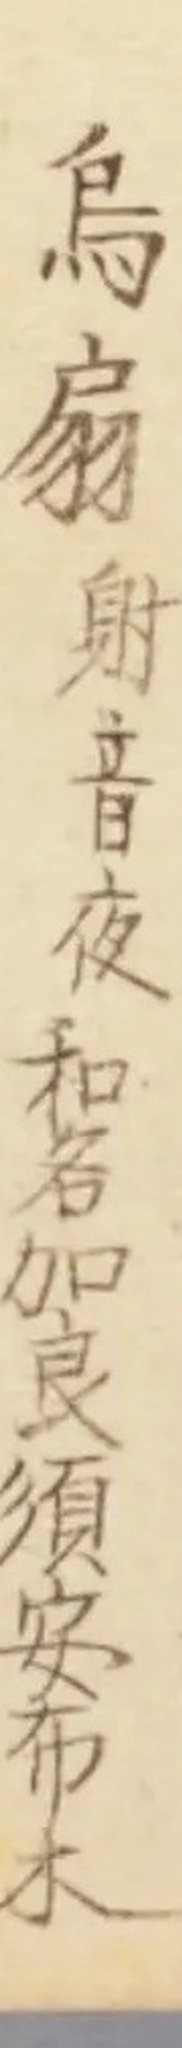烏扇射音夜和名加良須安布水
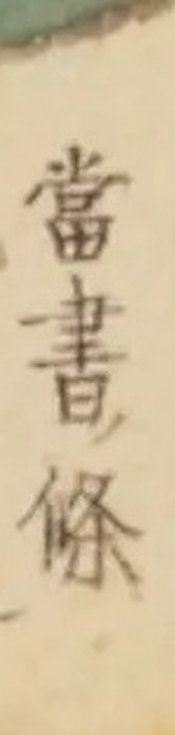當書ノ条
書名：梅園草木花譜夏之部. 1
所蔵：国立国会図書館 National Diet Library, JAPAN
